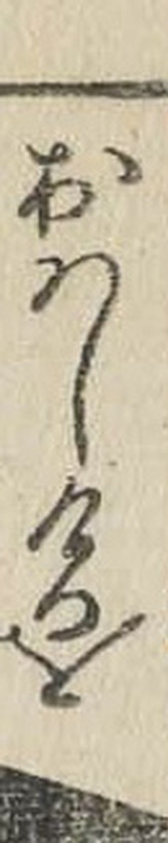おはしけるを
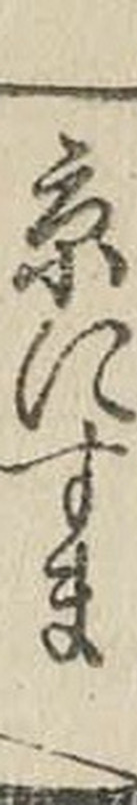京にすま
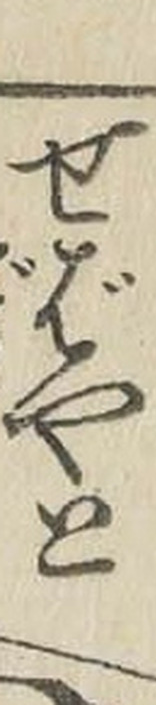せばやと
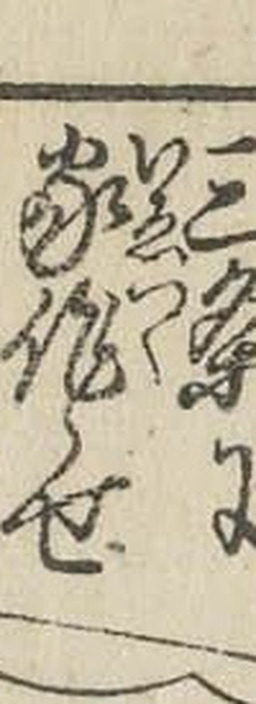家作らせ
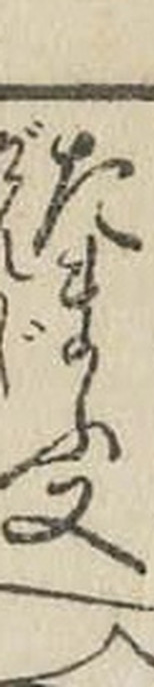たまふ又
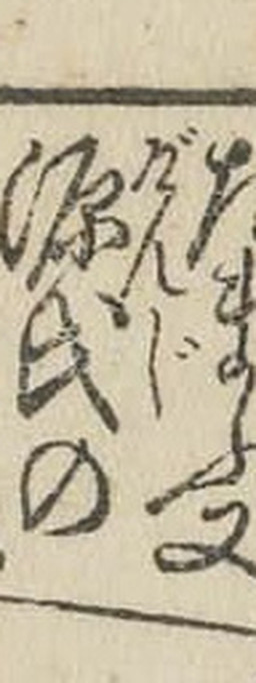源氏の
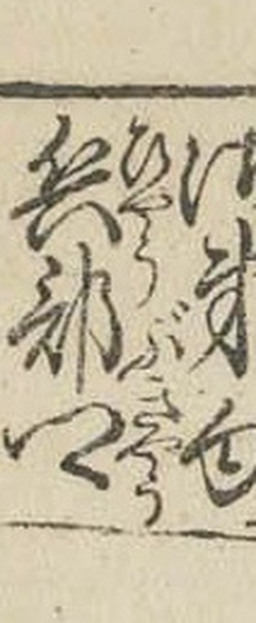兵部卿
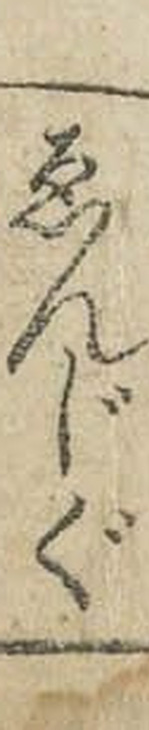ゑんじぐ
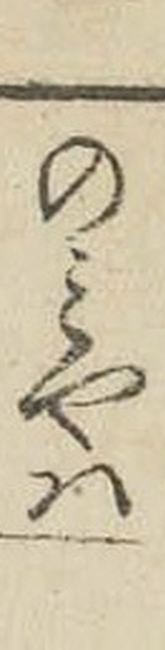のみやは
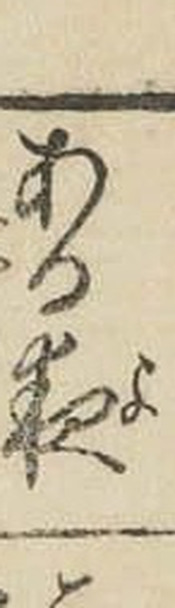ある夜
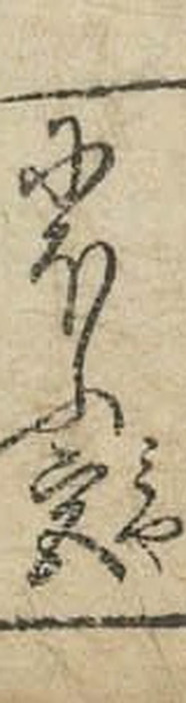にほふ宮
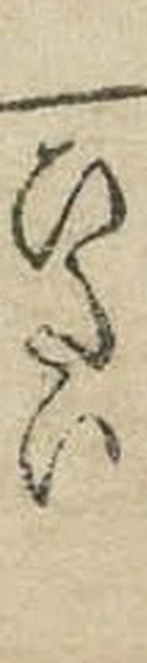ひたい
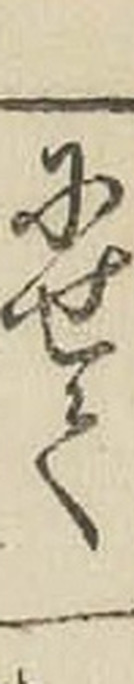にせて
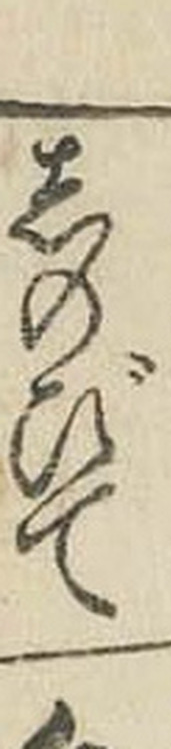しのびて
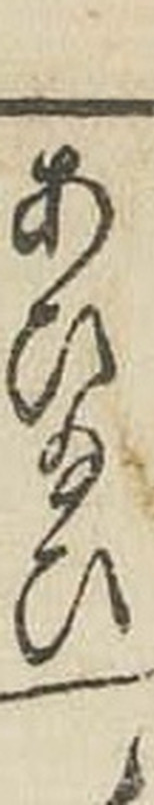あひ給ひ
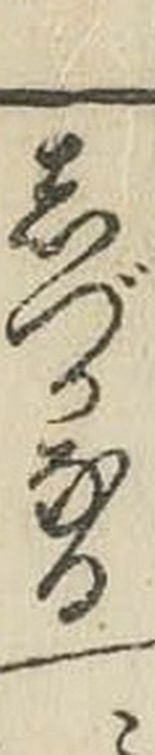しづかなる
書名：絵本写宝袋 9巻 1之巻
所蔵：東京学芸大学教育コンテンツアーカイブ
